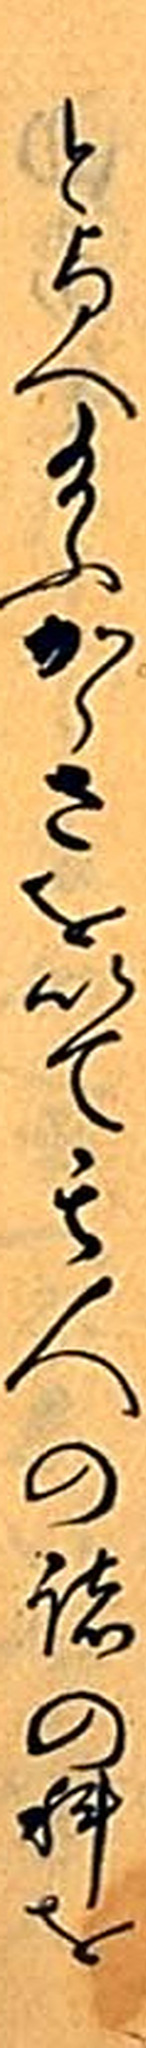と与へ給ふからさを以て其人の諸の科を
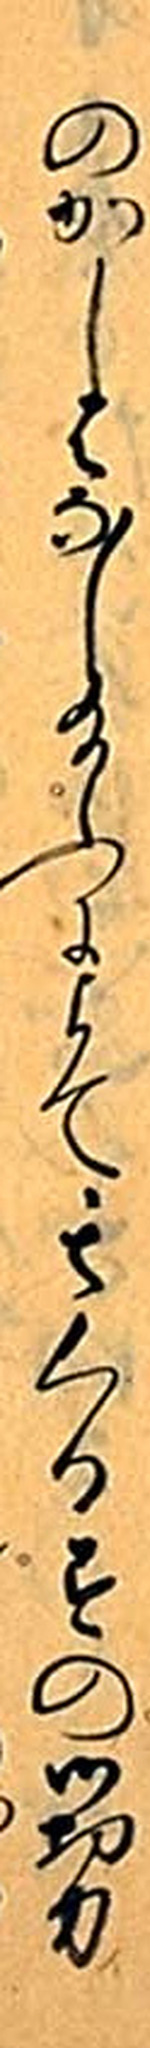のかしはなし給ふによて其くるすの御功力
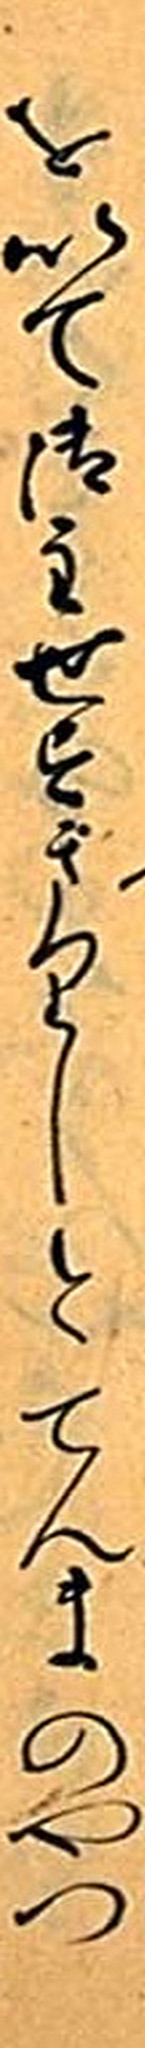を以て御主せすきりしとてんまのやつ
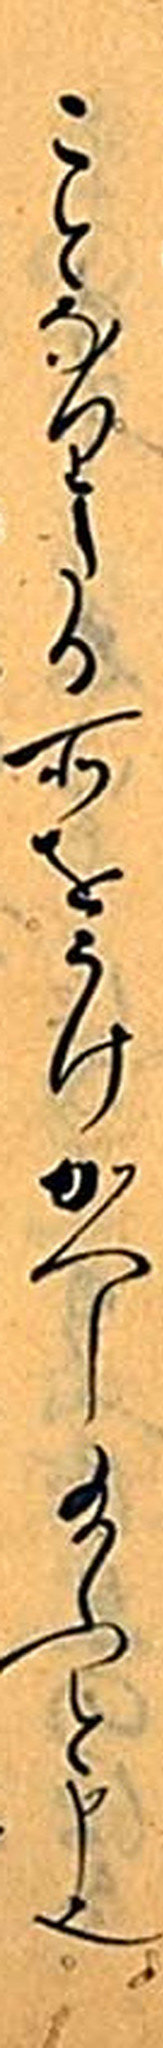ことなりたる所をうけかへし給ふと申也
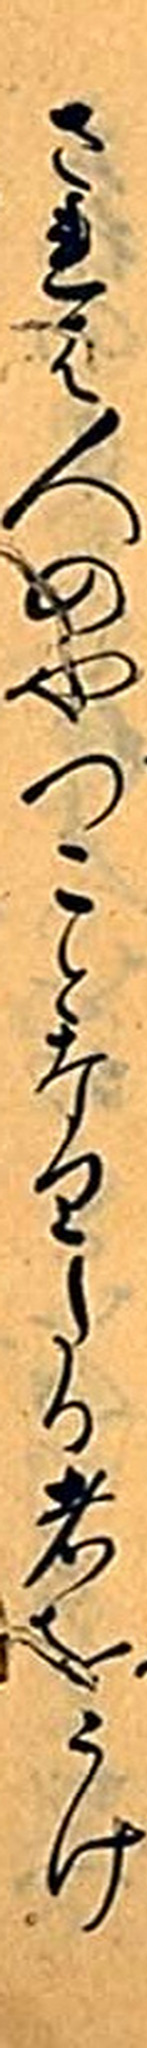されは人のやつことなりたる者をうけ
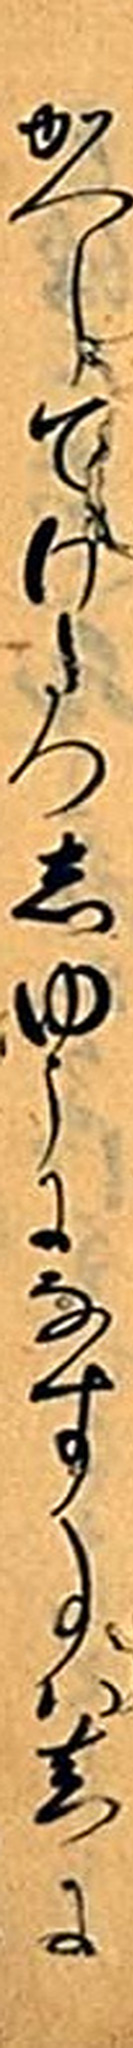かへしてけたつしゆうになす事は真に
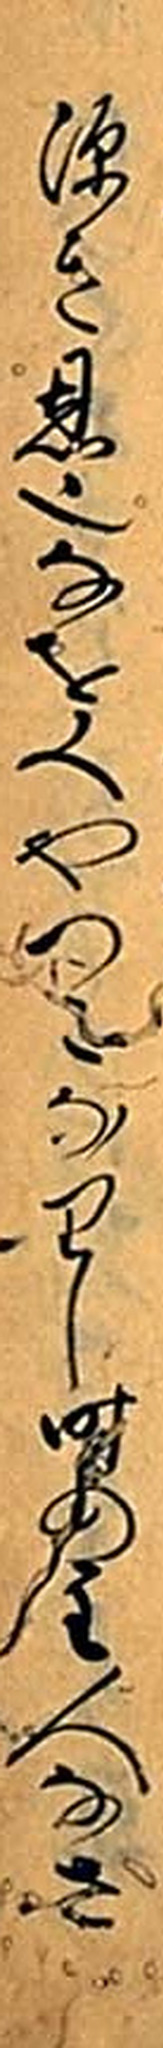深き恩也なを又やつこなりし時の主人なさ

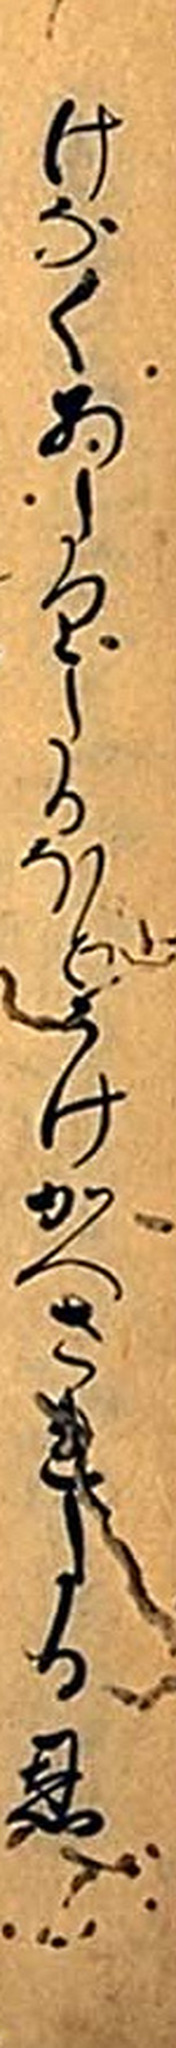けなくあたりたるほとかけかへされたる恩
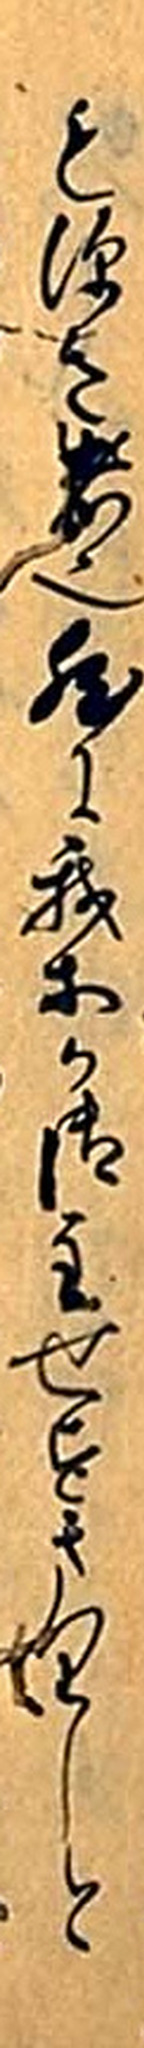も深き者也然に我等か御主せすきりしと
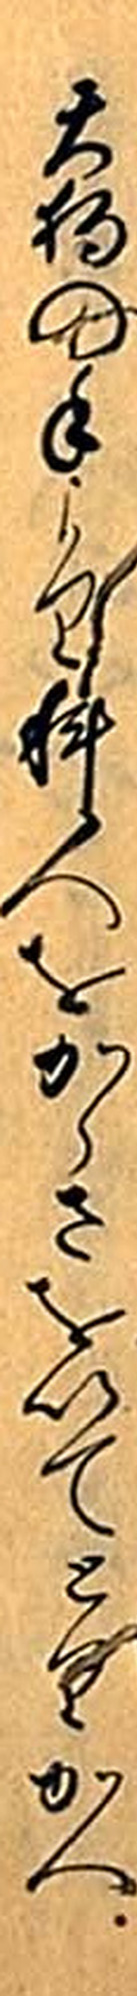天狗の手より科人をからさを以てとりかへ
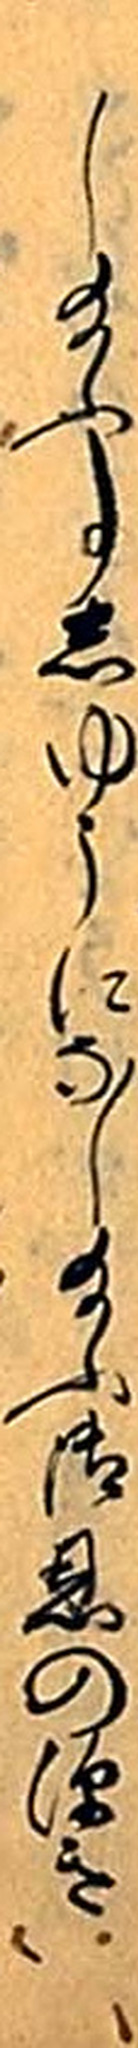し給ふ事しゆうになし給ふ御恩の深き
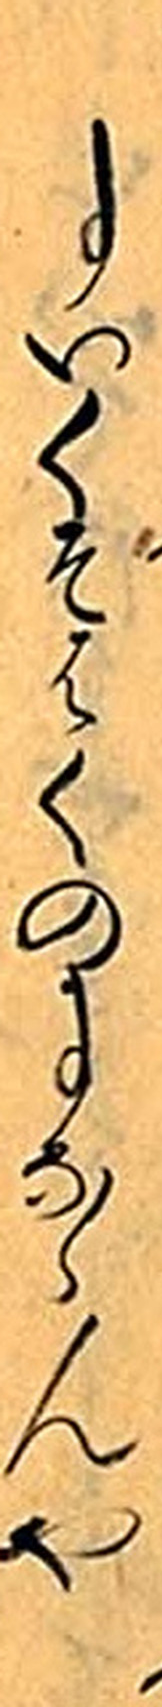事いくそはくの事ならんや
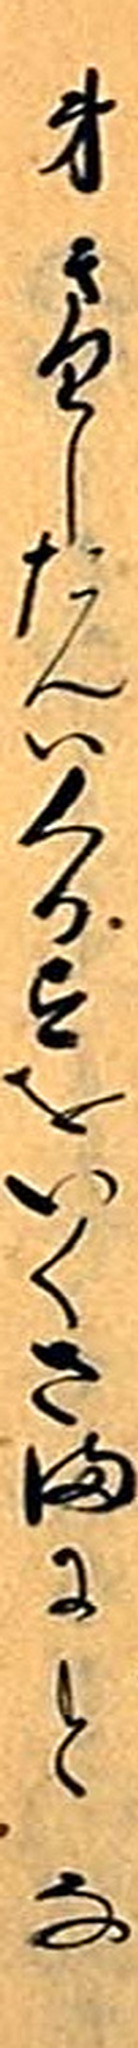弟きりしたんはくるすをいくさまにとな
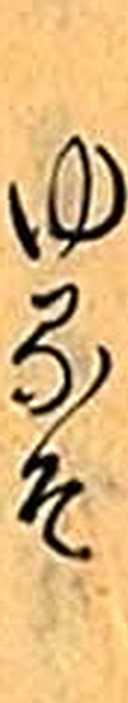ゆるそ
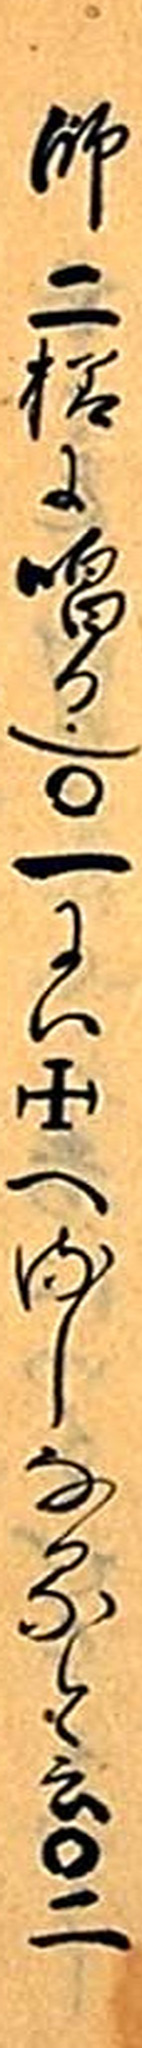師二様に唱る也○一には☩へるしなると云○二
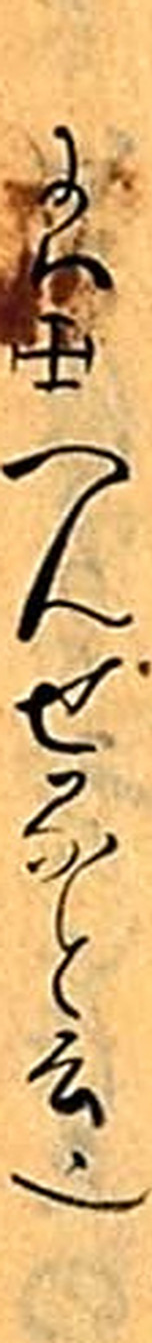には☩へんせると云也
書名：ドチリナ・キリシタン
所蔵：東京大学総合図書館 / General Library in the University of Tokyo
